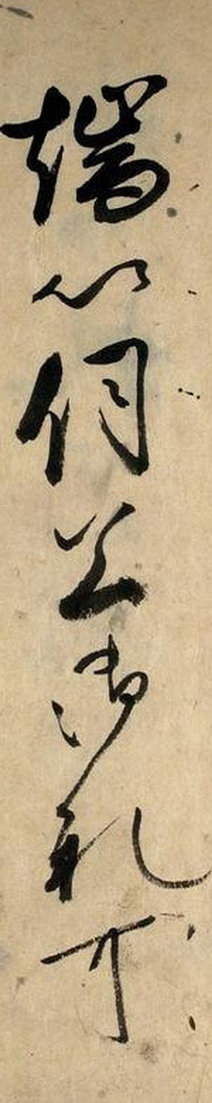端以伺公御礼可
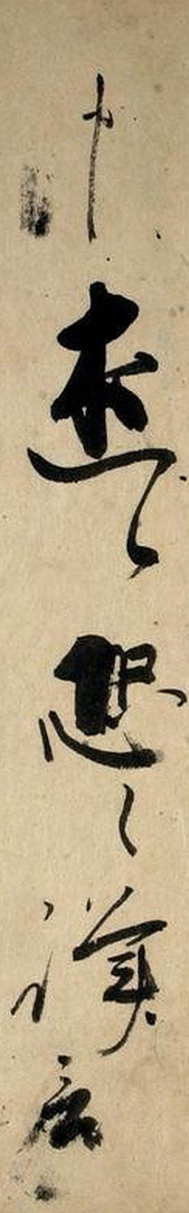申述候恐々謹言
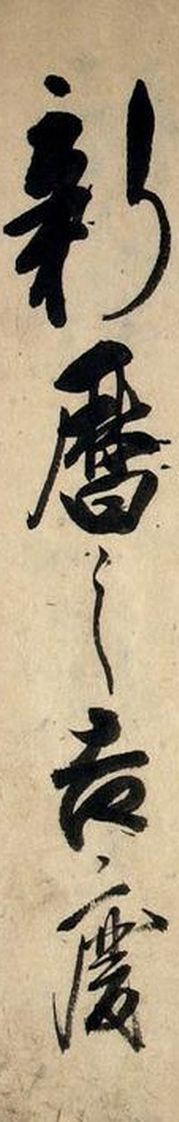新暦之吉慶

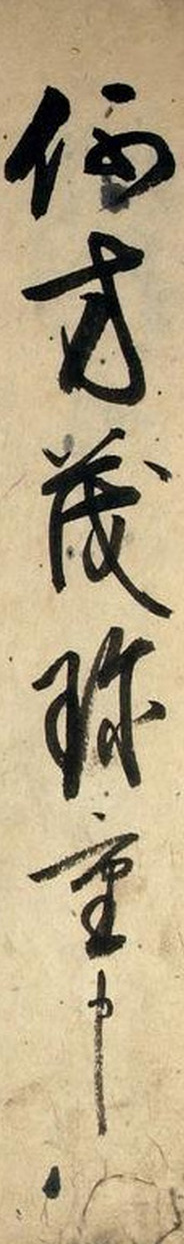何方も珍重申
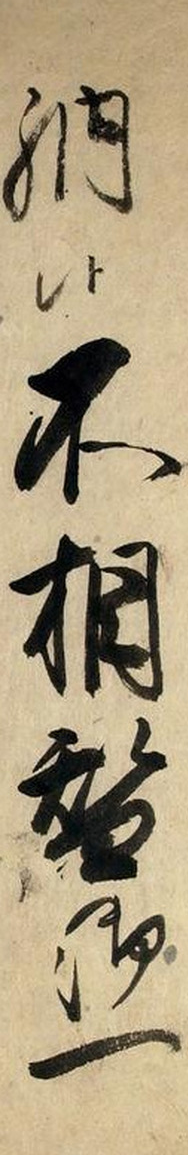納候不相替御一
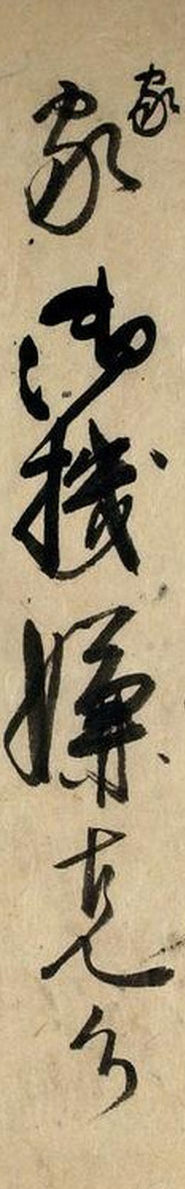家御機嫌克御
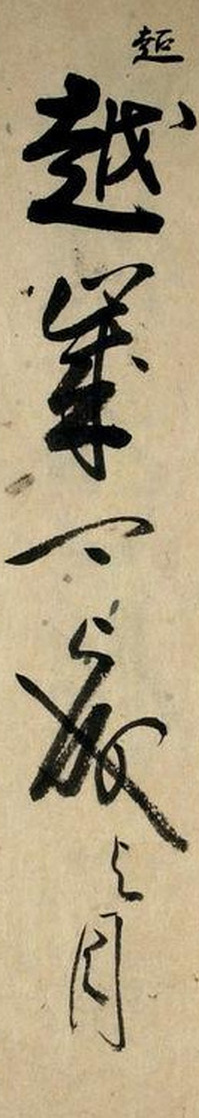越歳可被成と目
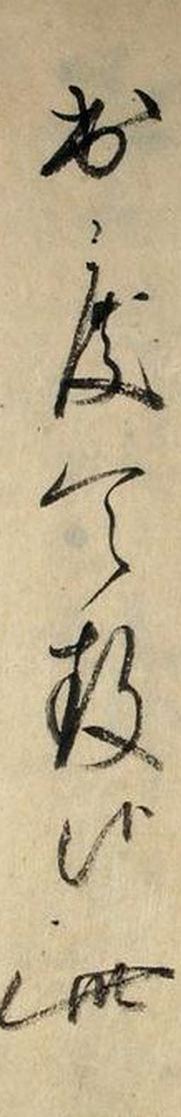出度令存候此
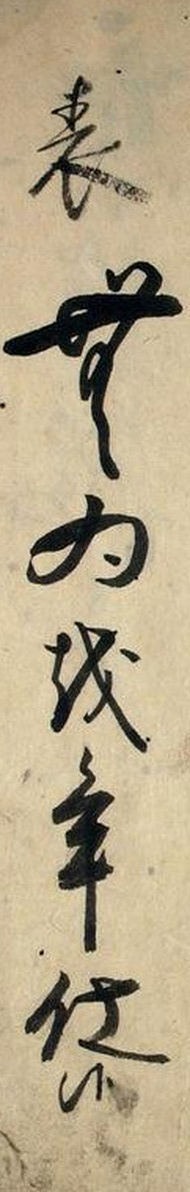表無為越年仕候

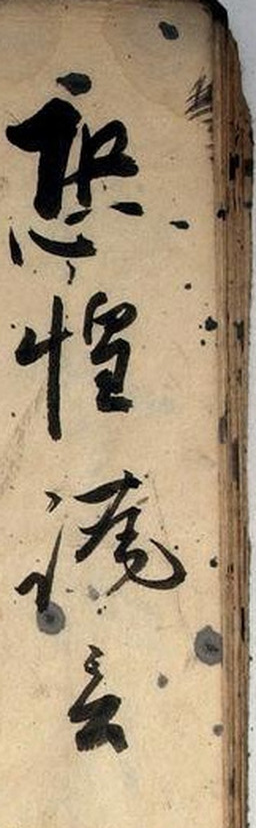恐惶謹言
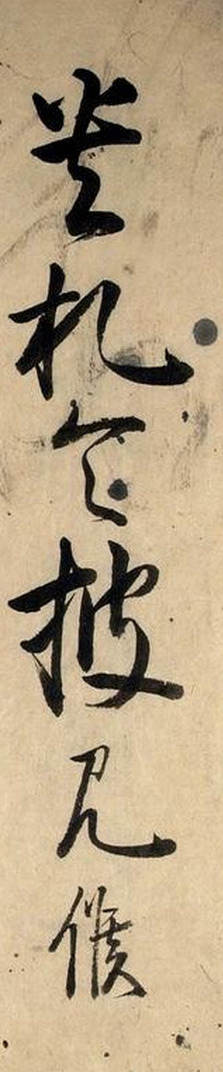貴札令披見候
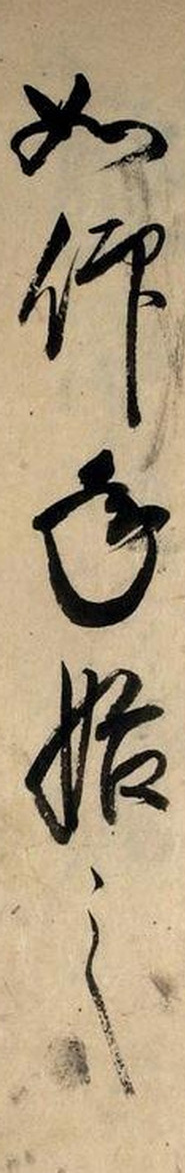如仰年始之
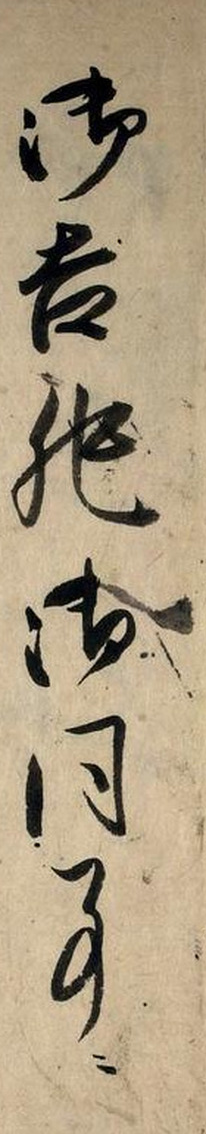御吉兆御同事ニ
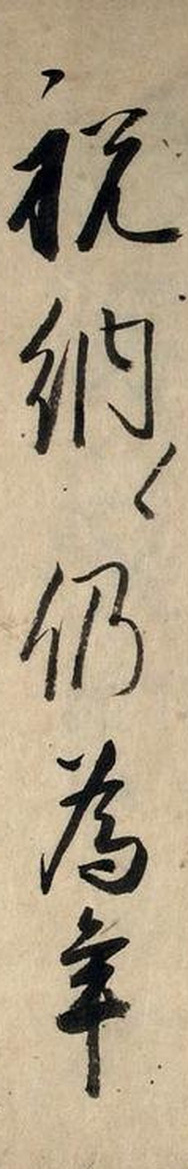祝納候仍為年
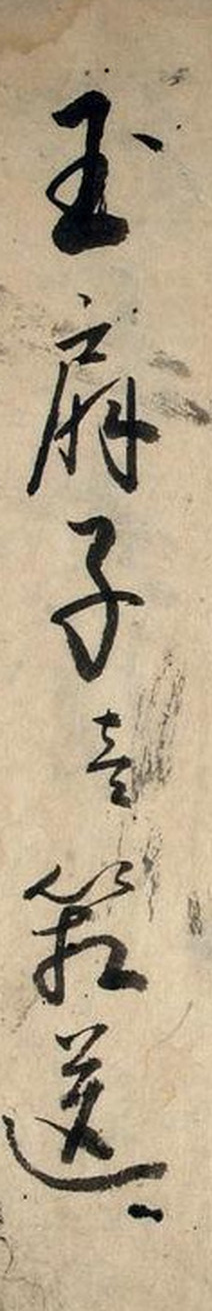玉扇子壱箱送

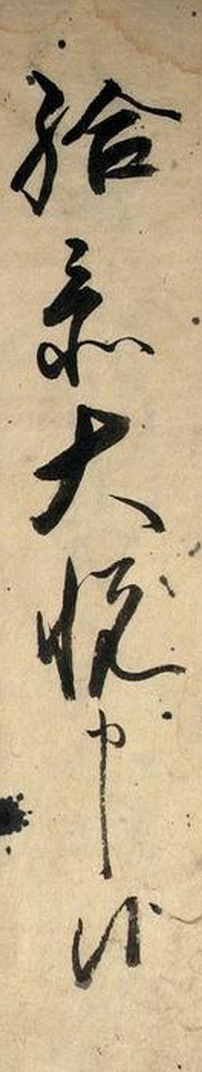給忝大悦申候
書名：御手本（手習、消息文、和漢朗詠集・論語の一節）
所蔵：福井県文書館 Fukui Prefectural Archives
